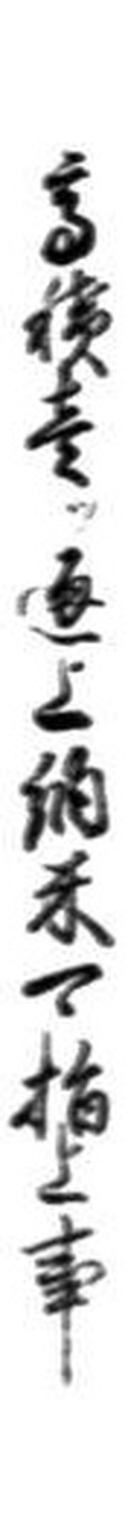高積壱ツ通上納米可指上事
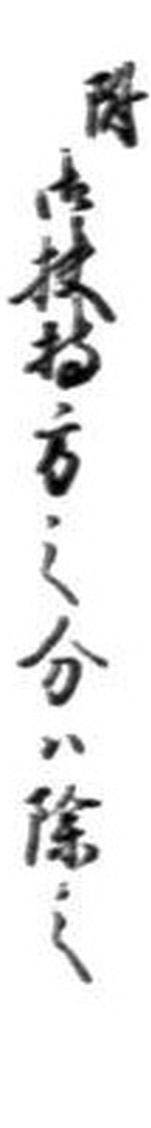御扶持方之分ハ除之
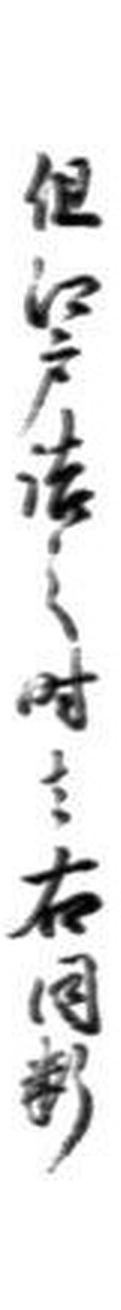但江戸詰之時者右同断
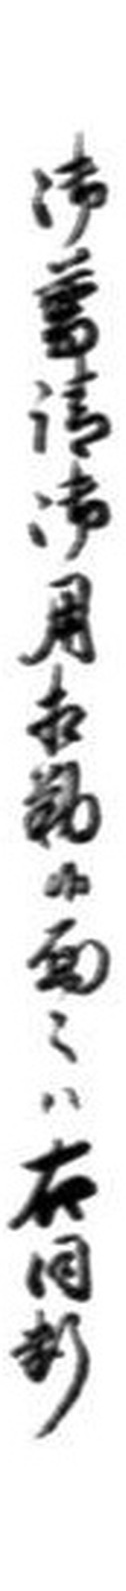御普請御用相勤候面々ハ右同断
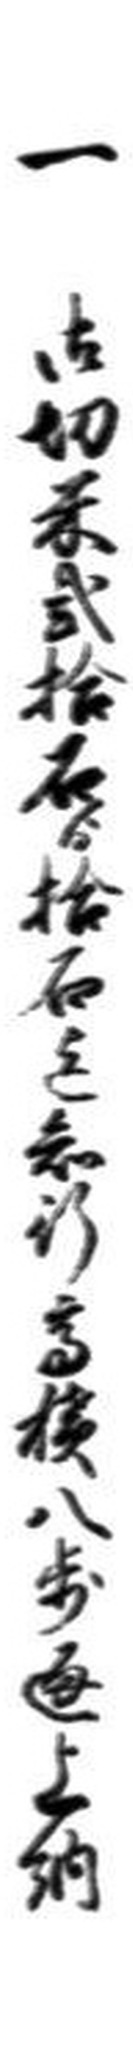一御切米弐拾石ゟ拾石迄知行高積八歩通上納

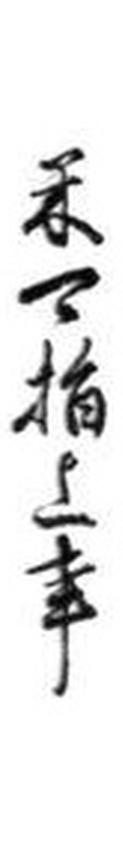米可指上事
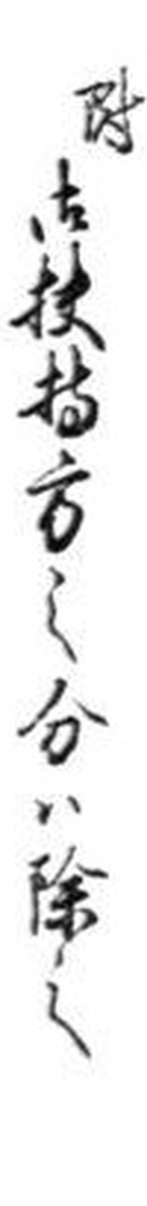御扶持方之分ハ除之
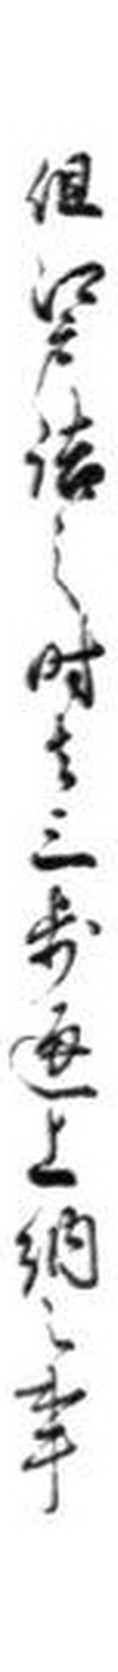但江戸詰之時者三歩通上納之事
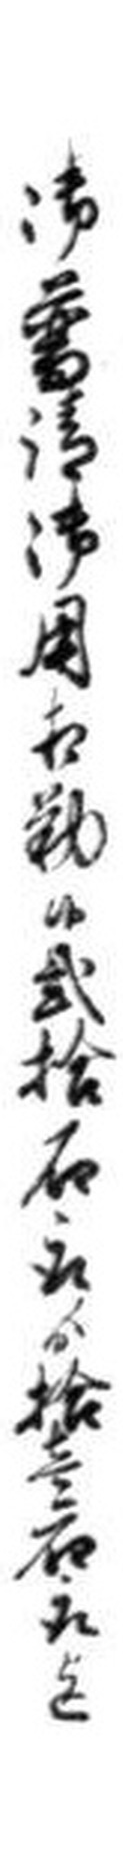御普請御用相勤候弐拾石取ゟ拾壱石取迄
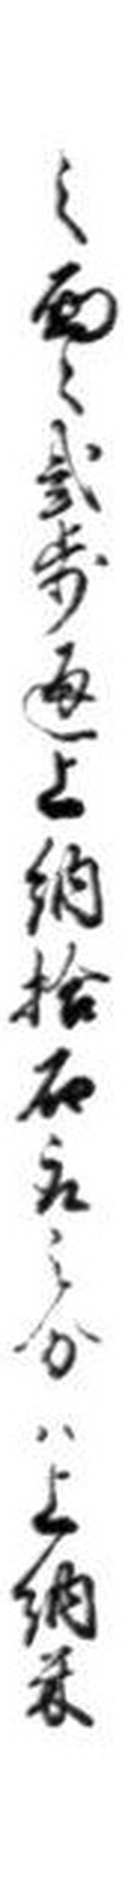之面々弐歩通上納拾石取之分ハ上納米
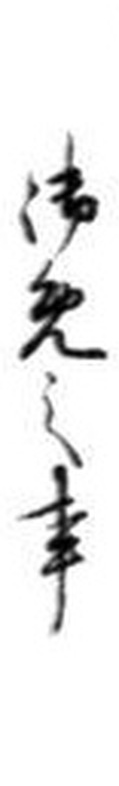御免之事
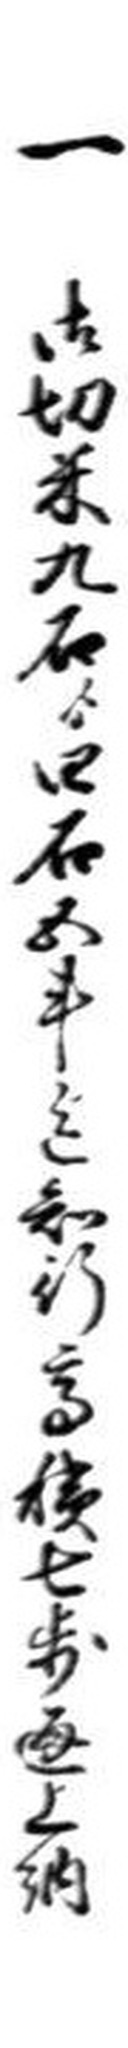一御切米九刻ゟ四石五斗迄知行高積七歩通上納
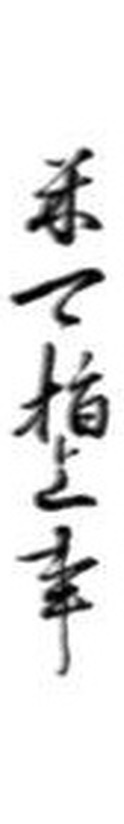米可指上事
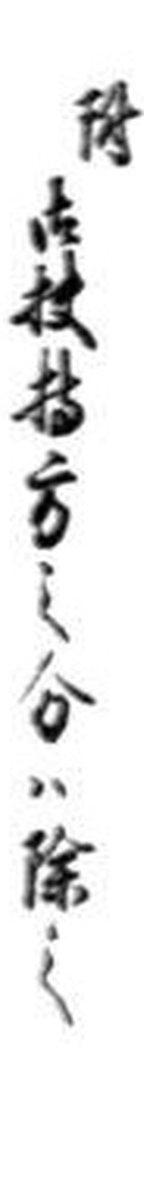御扶持方之分ハ除之
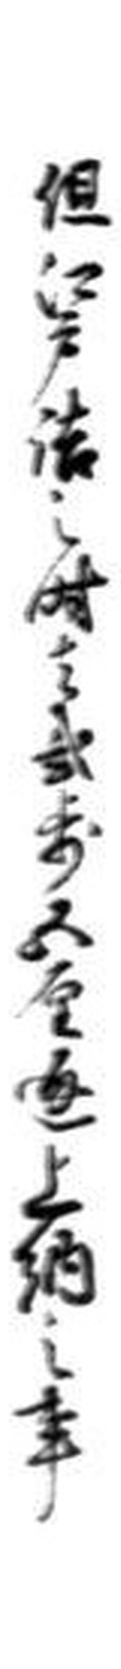但江戸詰之時者弐歩五厘通上納之事
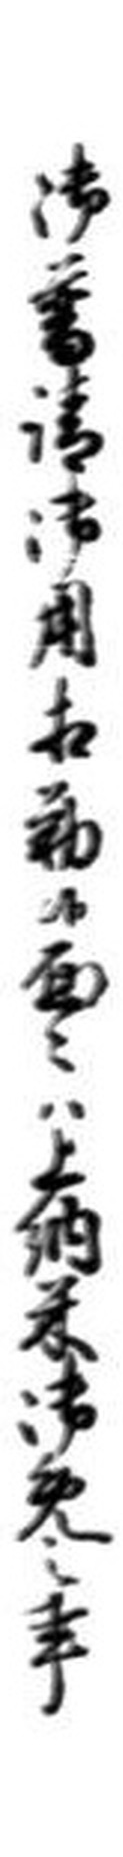御普請御用相勤候面々ハ上納米御免之事
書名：家譜 三十一 吉邦公 享保元年
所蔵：福井県文書館 Fukui Prefectural Archives
